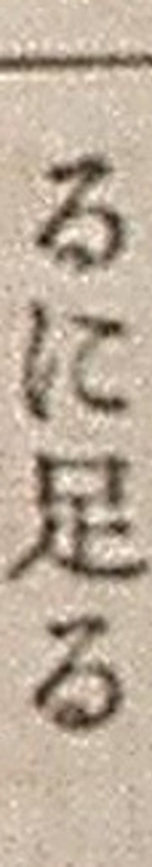るに足る
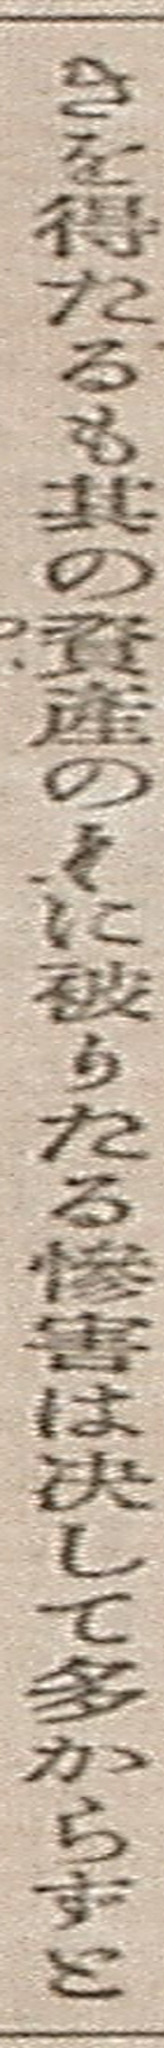きを得たるも其の資産の多に被りたる惨害は决して多からずと
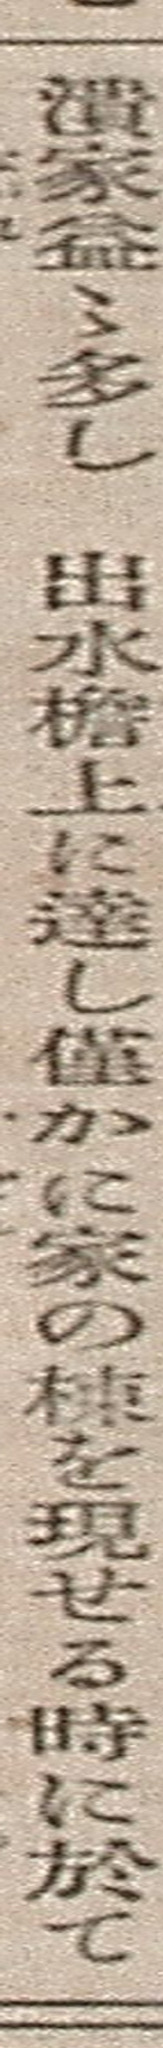潰家増々多し出水擔上に達し僅かに家の棟を現せる時に於て
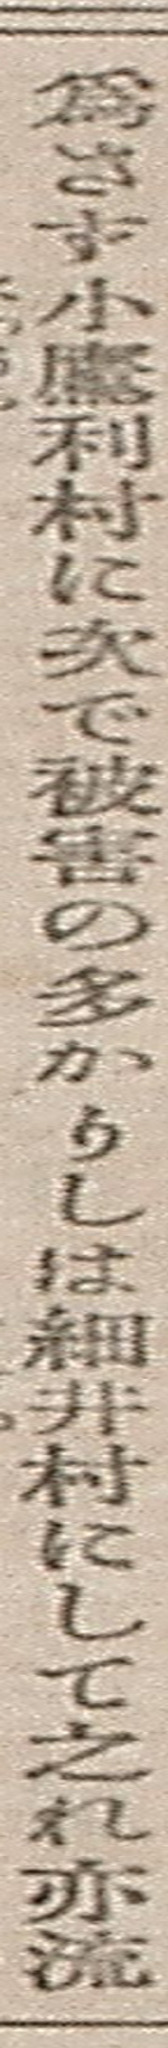為さず小鷹利村に次で被害の多かりしは細井村にして之れ亦流
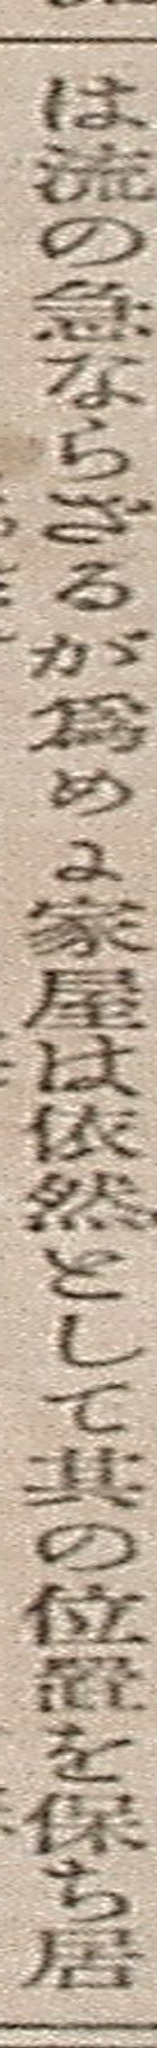は流の急ならざるが為めに家屋は依然として其の位置を保ち居
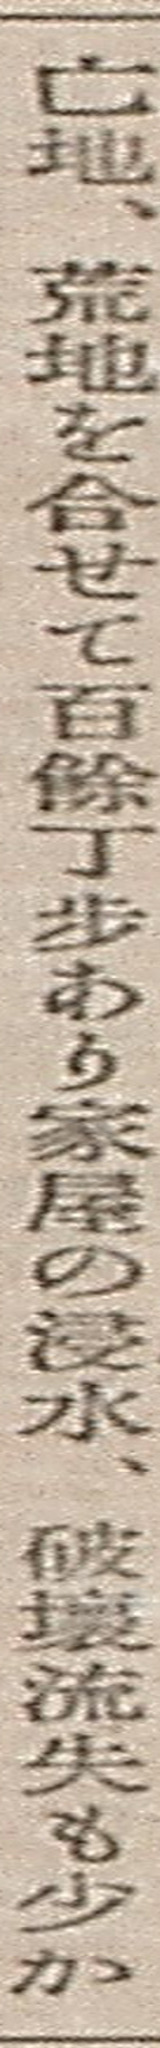亡地、荒地を合せて百餘丁歩あり家屋の浸水、破壊流失も少か
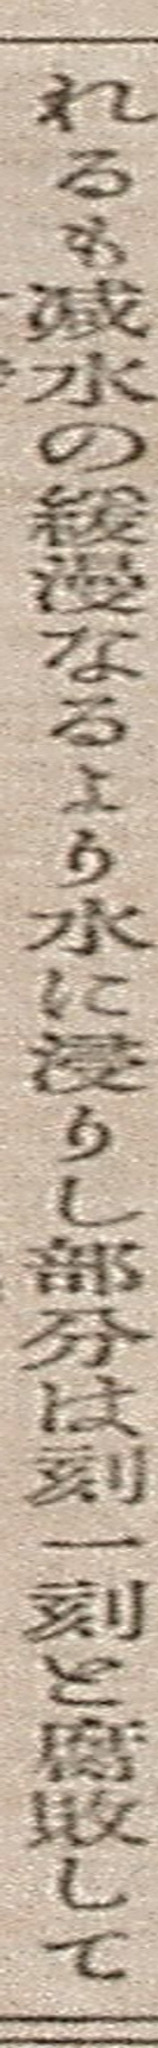れるも減水の緩慢なるより水に浸りし部分は刻一石と腐敗して
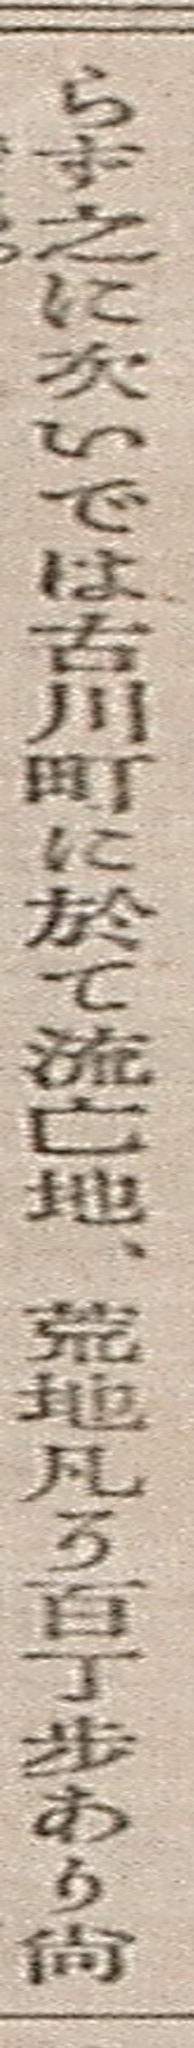らず之に次いでは古川町に於て流亡地、荒地凡そ百丁歩あり尚
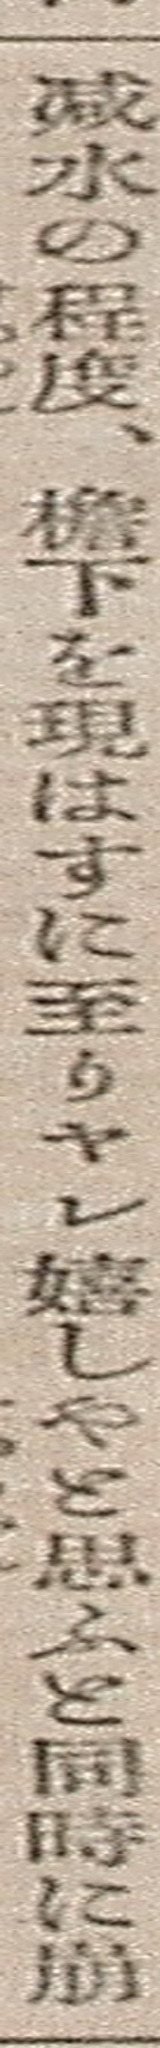減水の程度、擔上を現はすに至りヤレ嬉しやと思ふと同時に崩
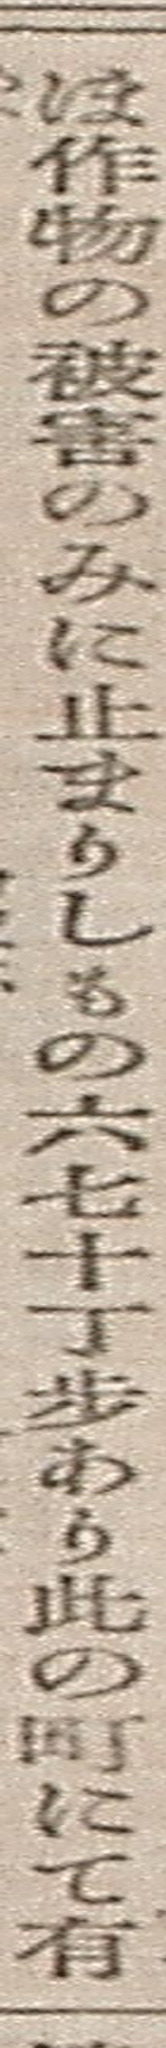ほ作物のみに止まりしもの六七十丁歩あり此の町にて有
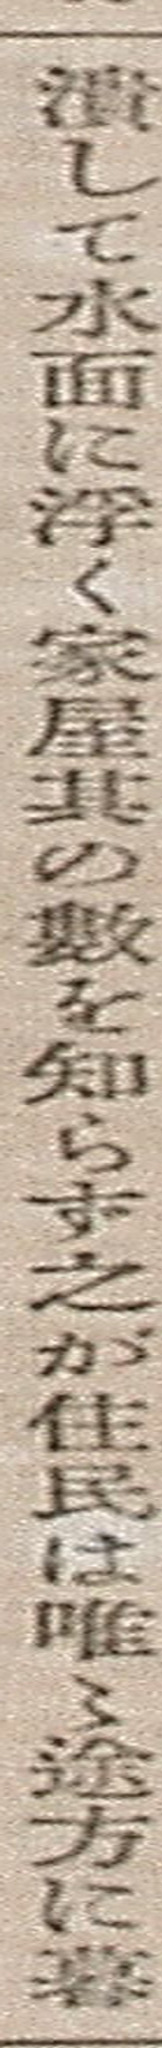潰して水面に浮く家屋其の数を知らず之が住民は唯々途方に暮
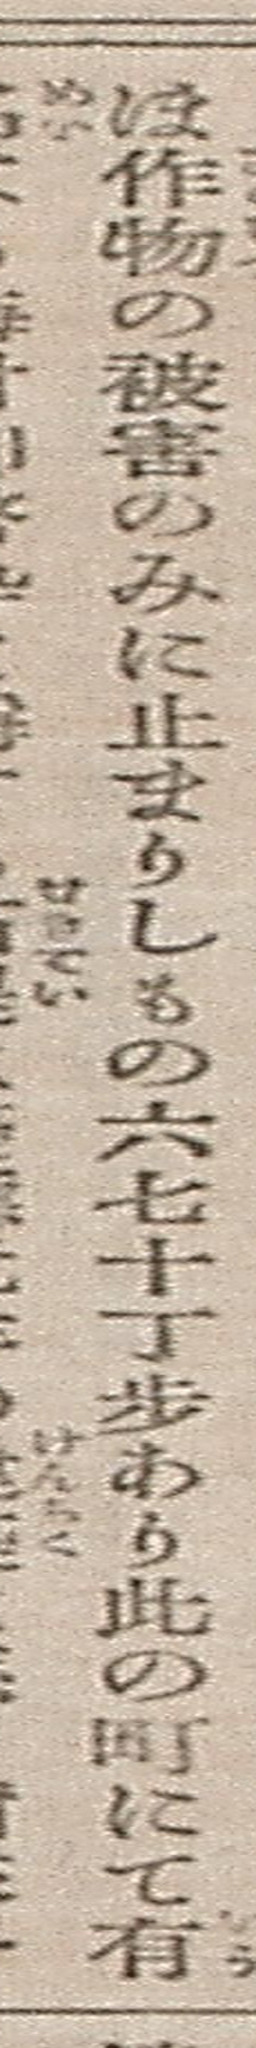ほ作物のみに止まりしもの六七十丁歩あり此の町にて有
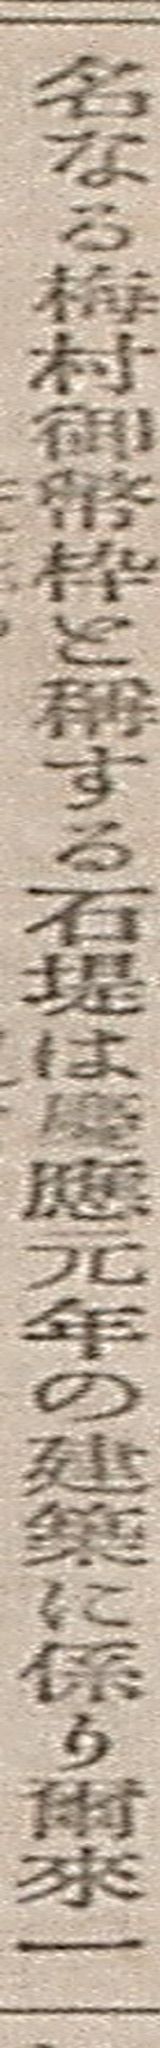名なる梅村御弊枠と称する石提は慶応元年の建築に係り爾来一
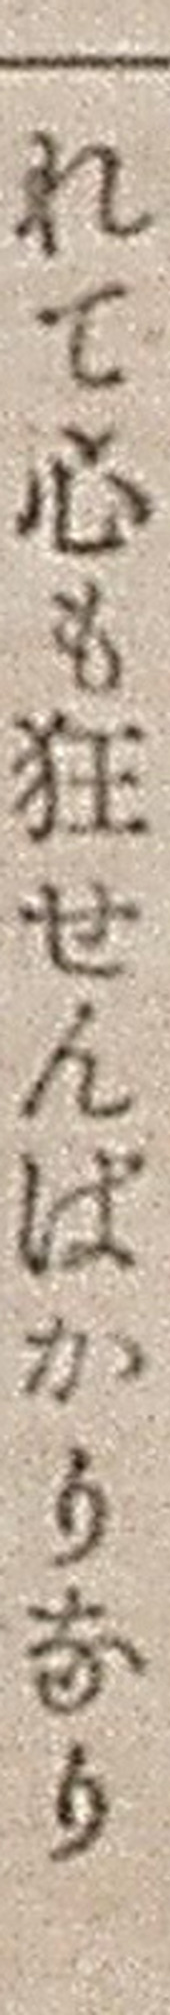れて心も狂せんばかりなり
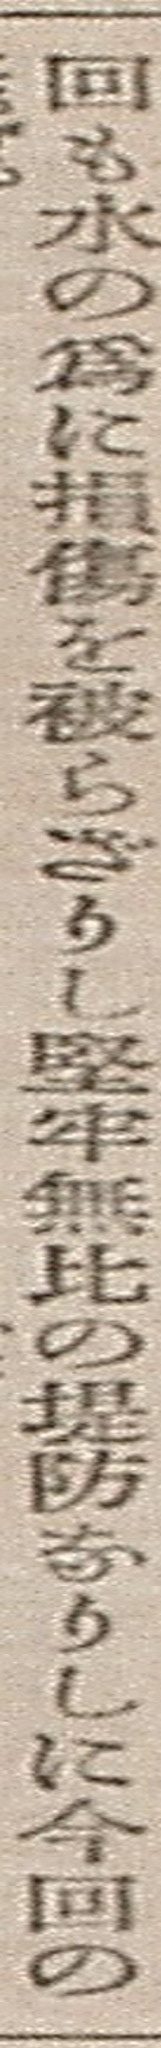回も水の為に損傷を被らざりし堅牢無比の堤防なりしに今回の
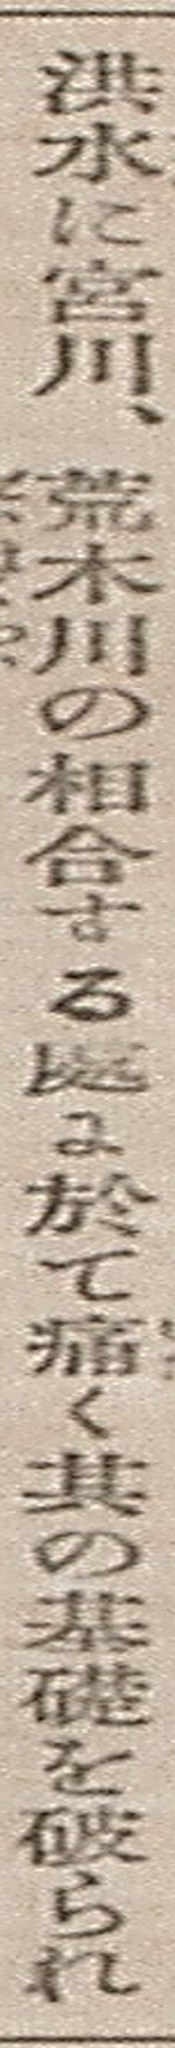洪水に宮川、荒木川の相合する処に於て痛く其の基礎を破られ
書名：風俗畫報臨時増刊第百二十六號　洪水被害録（中）
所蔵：東京大学地震研究所図書室 Earthquake Research Institute Library, The University of Tokyo, JAPAN
